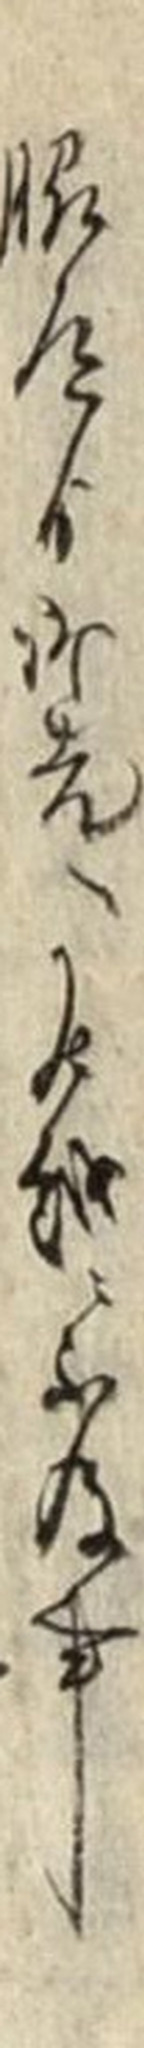脇道ゟ御先へ罷越に不及事
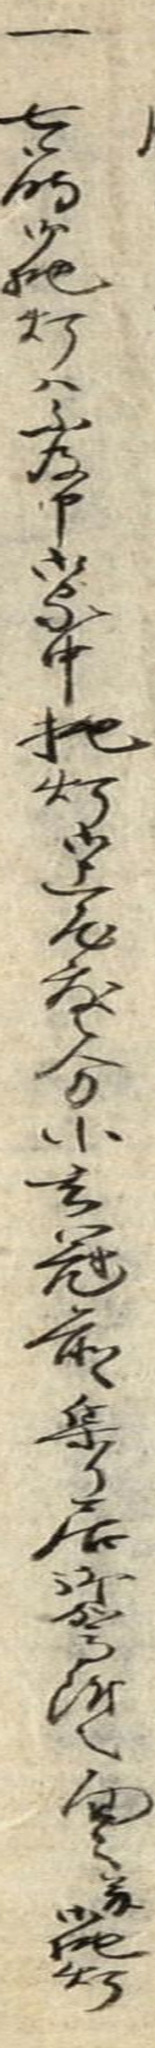一七ツ時御挑灯は不及申御家中挑灯御上屋敷之分小玄冠前へ集り居御駕附之面々并御挑灯
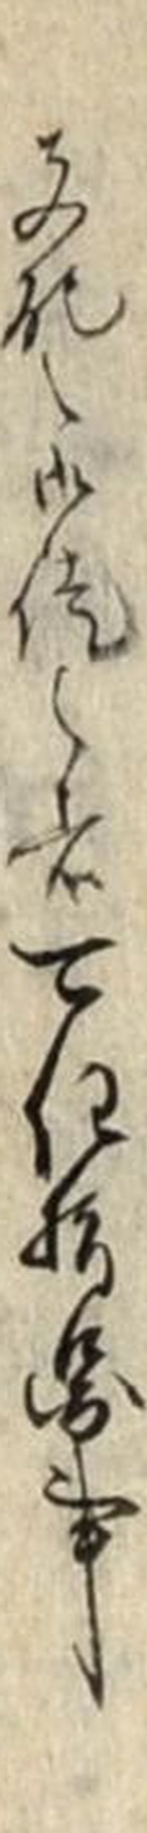支配之御徒之者可任指図事
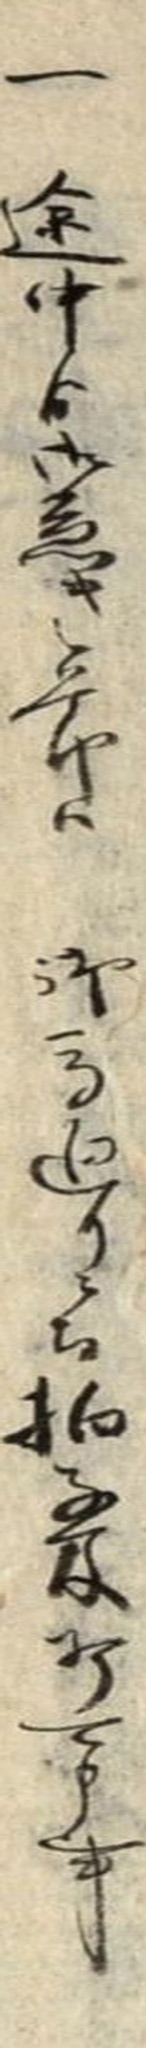一途中ゟ御急き之節は御馬廻りにて拍子木打可申事
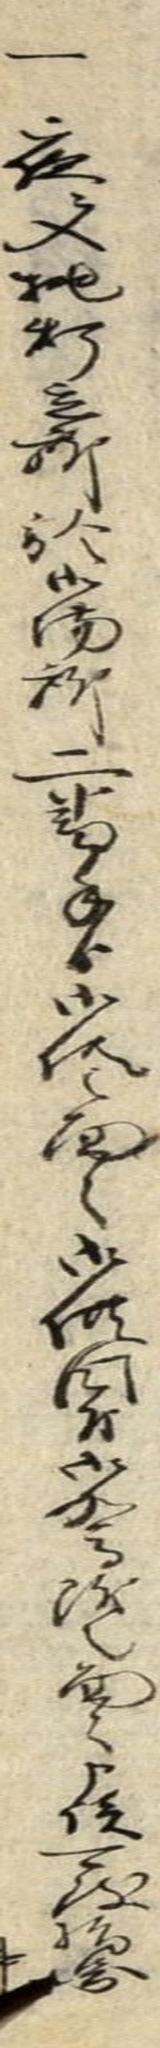一夜に入挑灯立所於御場所二番手ゟ御供之面々御供目付御駕附之面々申談可致指図事
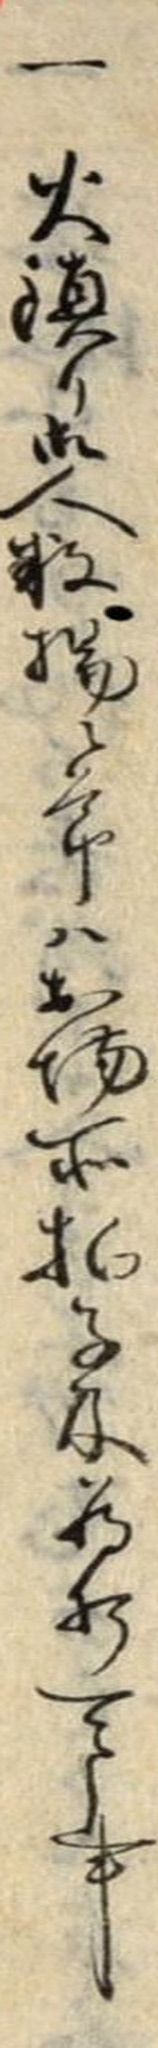一火鎮り御人数揚候節は於場所拍子木為打可申事

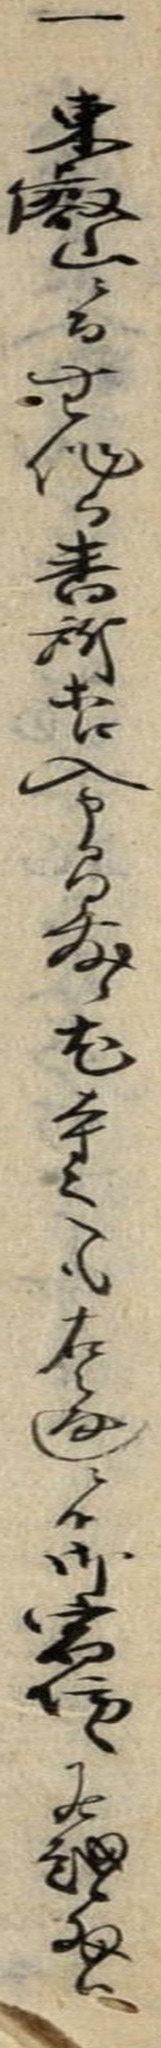一東叡山にて無作と番所等江入申間敷候尤寺々へも右之通に候御宿坊へ罷越候義は
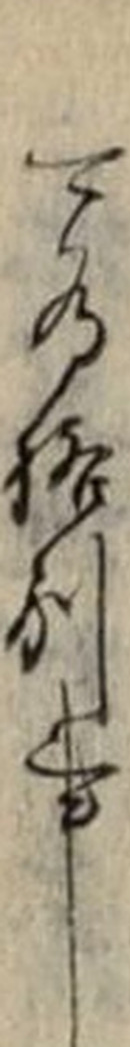可為格別事
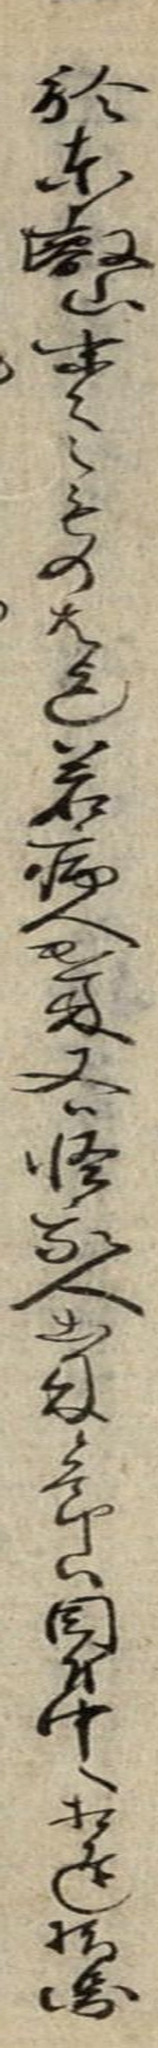一於東叡山末々之もの共迄若病人出来又は怪我人出来候節は目付中へ相達指図
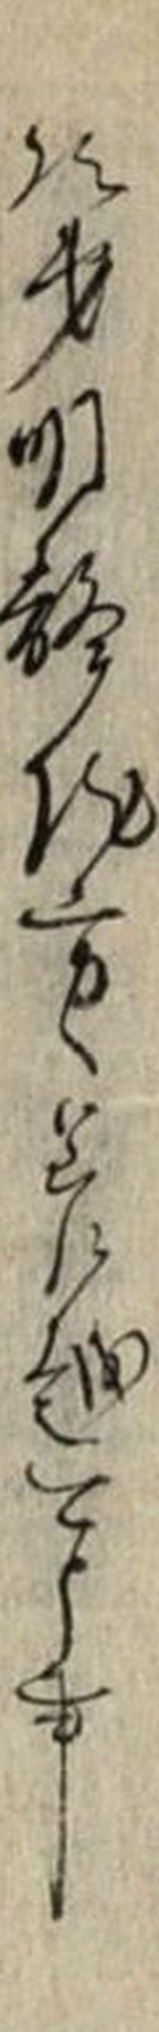次第明静院方へ差越可申事
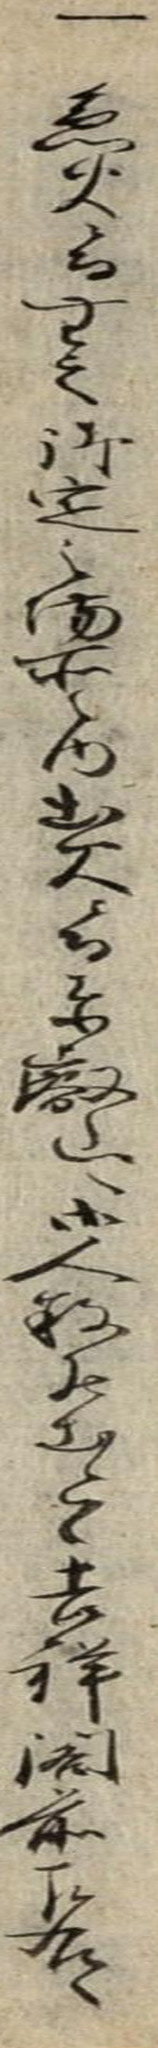一急火にて無之御定之場所之内出火にて東叡山へ御人数罷出候はゝ吉祥閣前左右へ
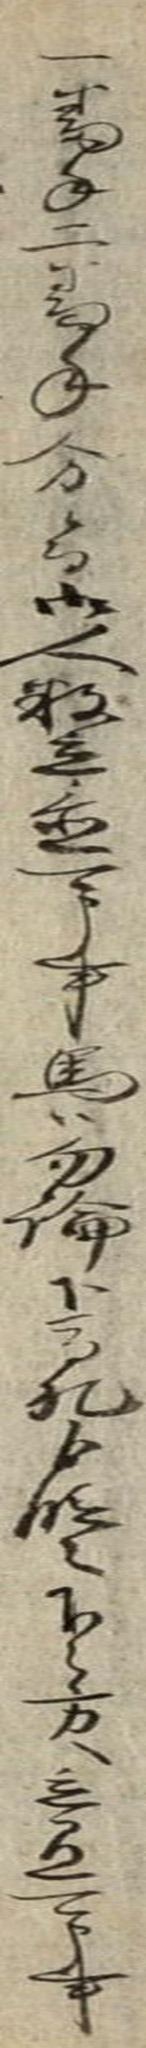一番手二番手分候て御人数立置可申事馬は勿論下馬札ゟ段々下之方へ立置可申事
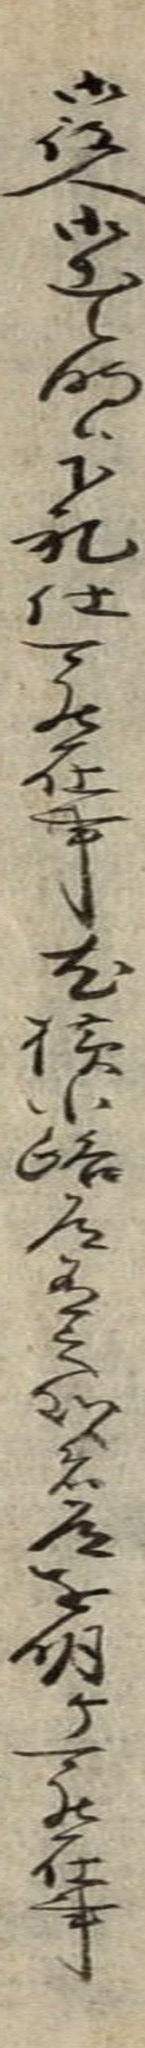御役人御出之時は下礼仕可罷在事尤横小路道有之処は道を明け可罷在事
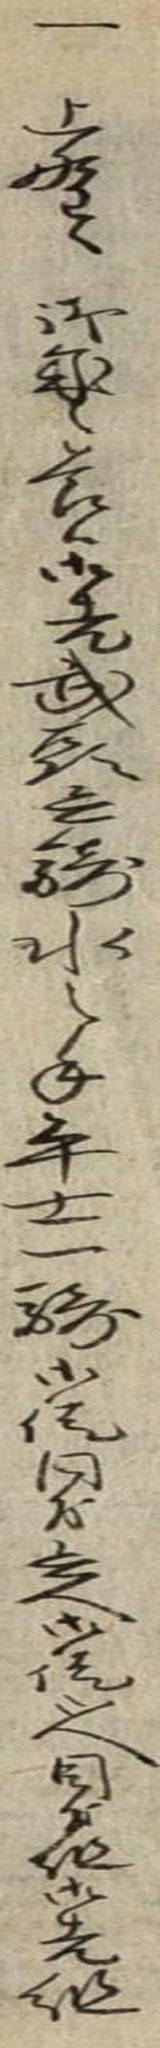一上野へ御成之節は御先武頭壱騎水之手平士一騎御徒目付壱人御徒弐人目付組御先組
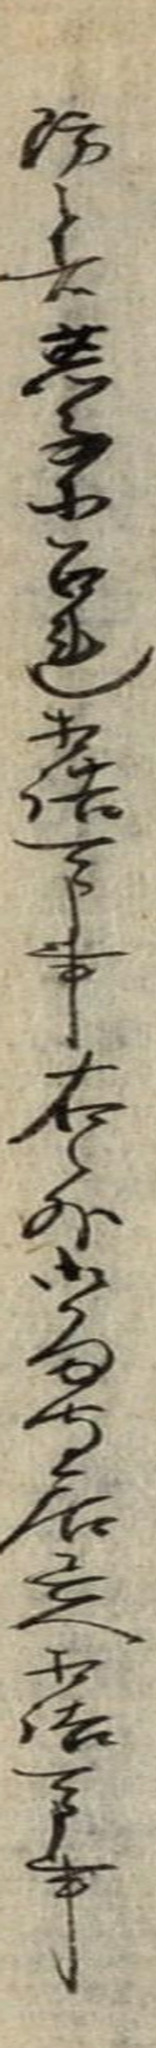防之者荒子等召連相詰可申事右之外御留守居壱人相詰可申事
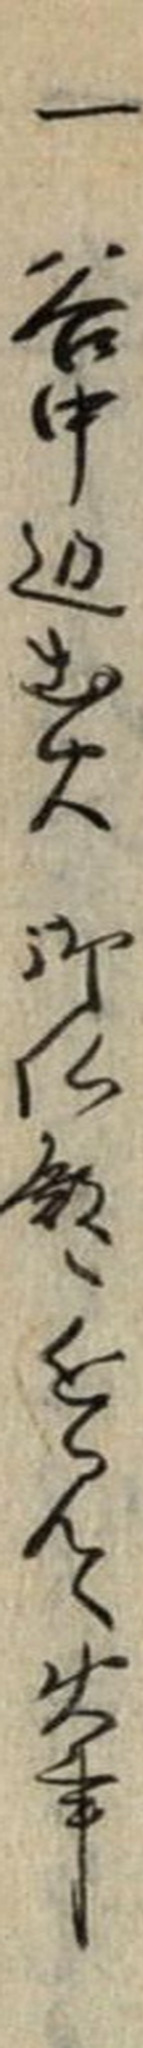一谷中辺出火御仏殿へ近見へ火事
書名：三都并道中之部
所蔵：福井県文書館 Fukui Prefectural Archives
